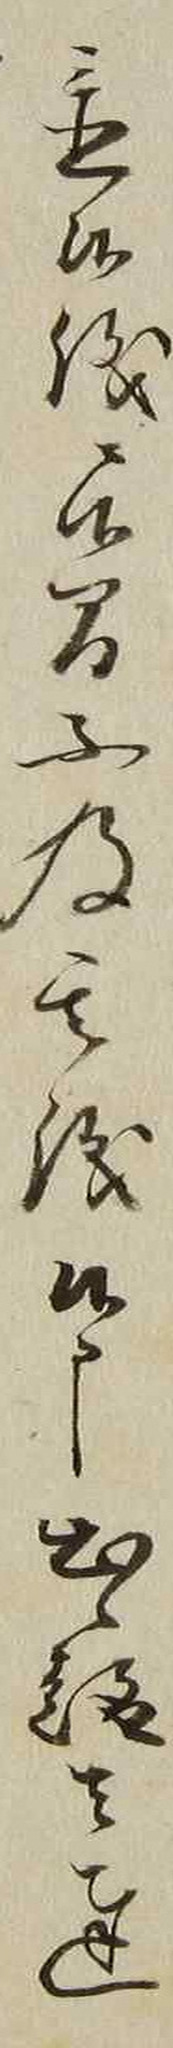置候儀ニ候間不及其儀候申出候趣者達
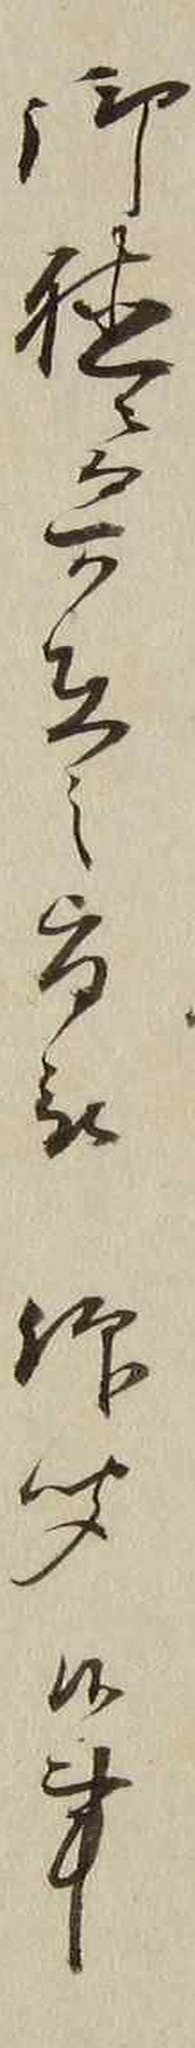御聴候而可在之旨被仰聞候事
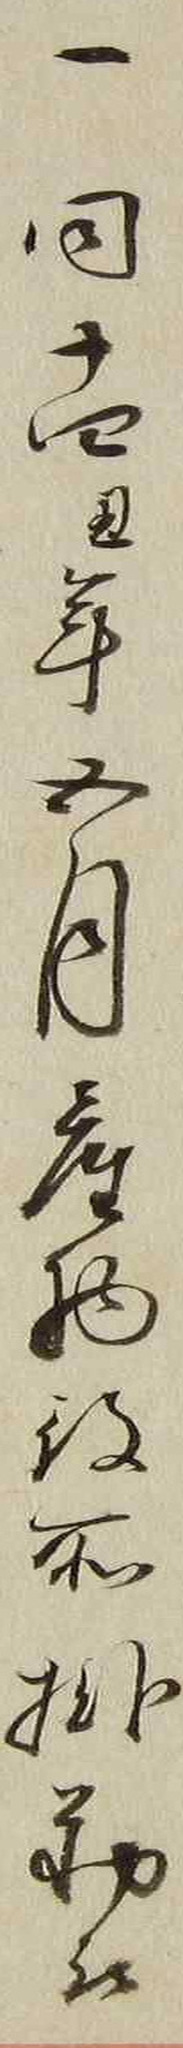一同十四丑年五月産物役所掛勤被
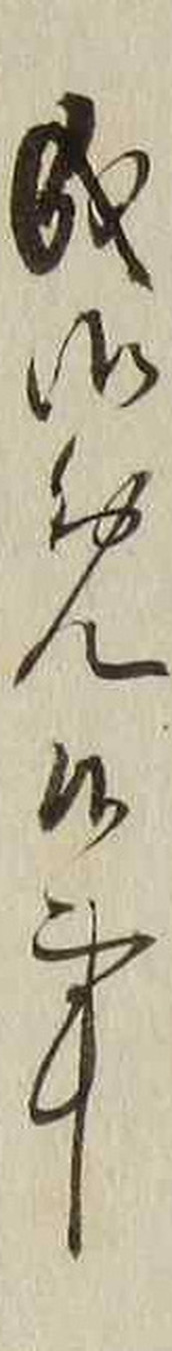成御免候事
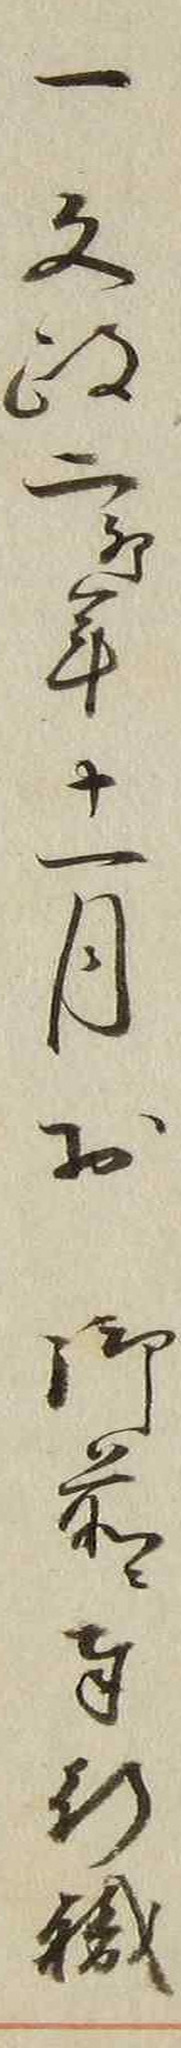一文政二卯年十一月於御前ニ奉行掛
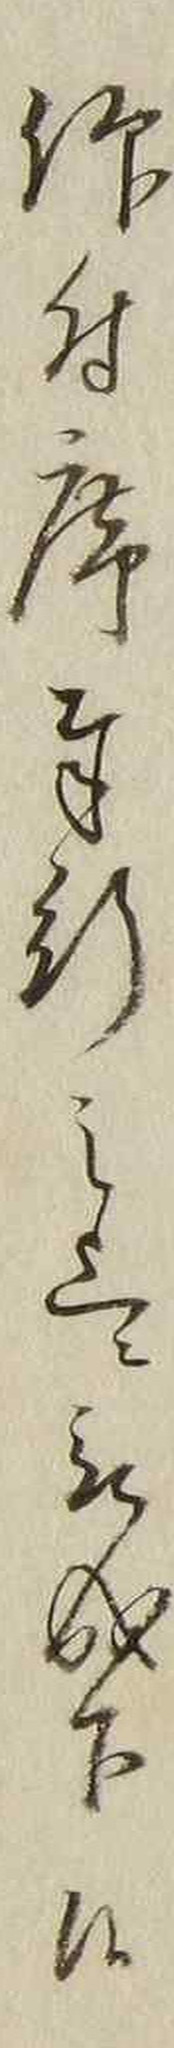被仰付席奉行之上ニ被成下候
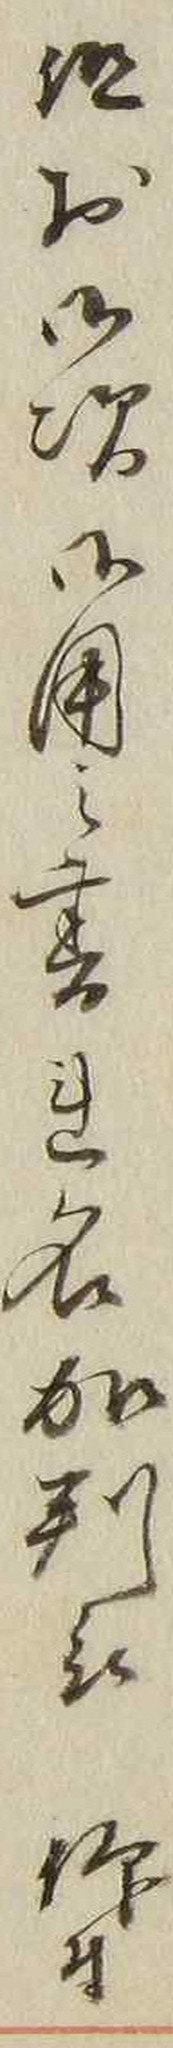但於御次御用之書連名加判被仰付
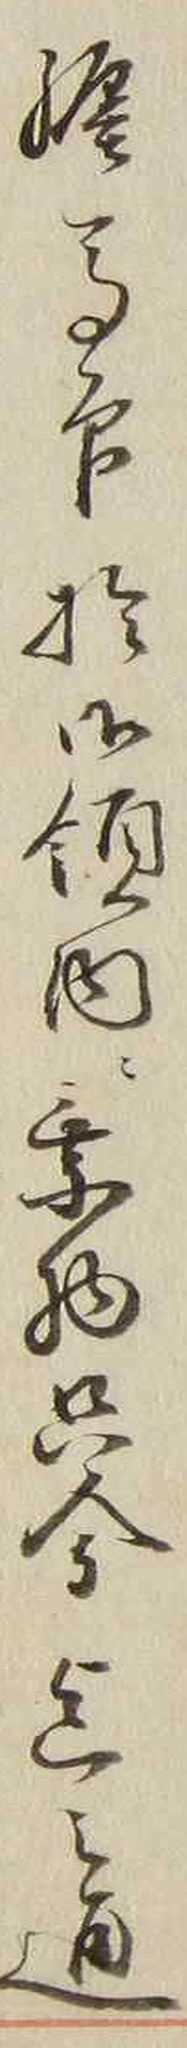纏馬印於御領内ニ乗物只今迄之通

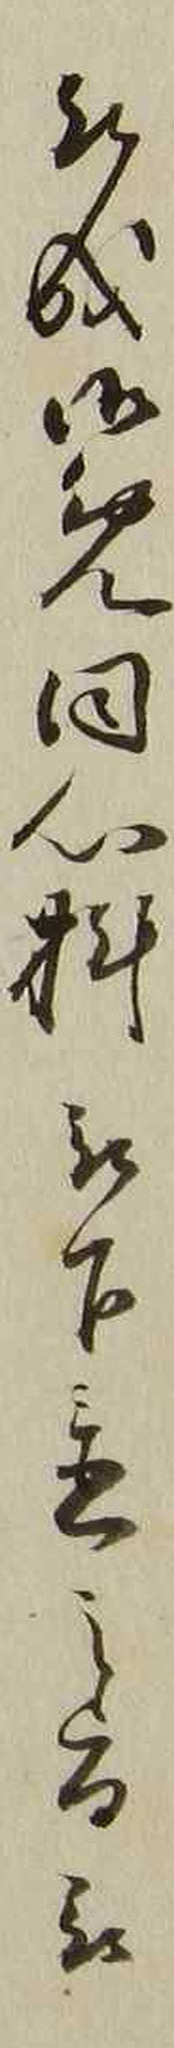被成御免同心料被下置之旨被
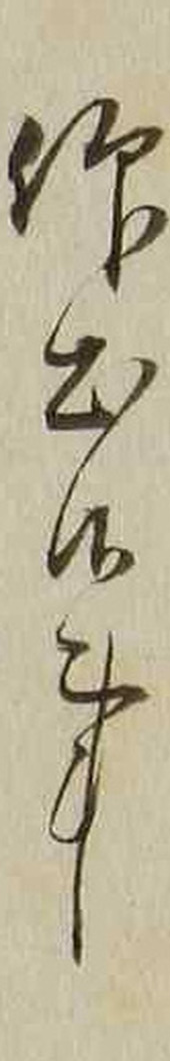仰出候事
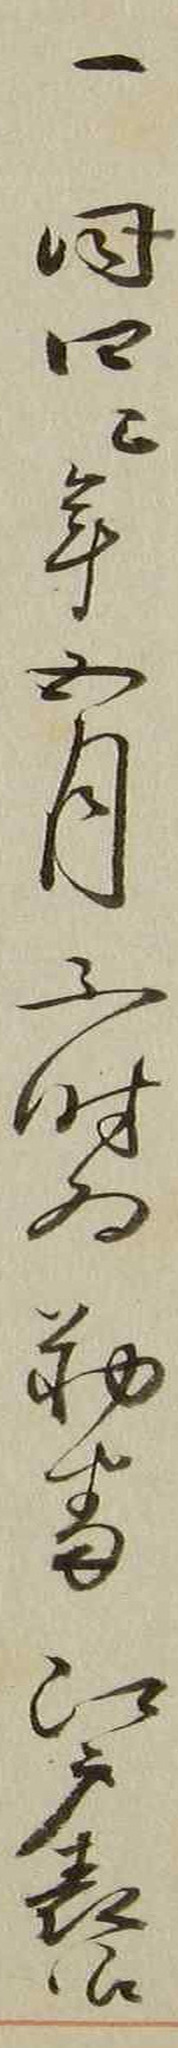一同四巳年五月不時為勤番江戸表江
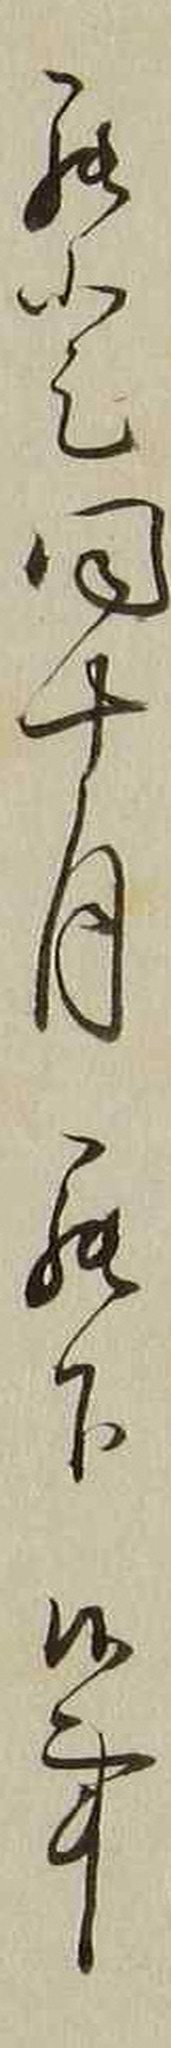罷登同十月罷下候事
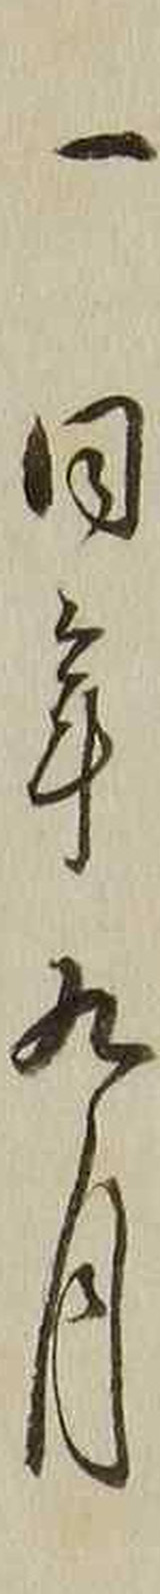一同年九月
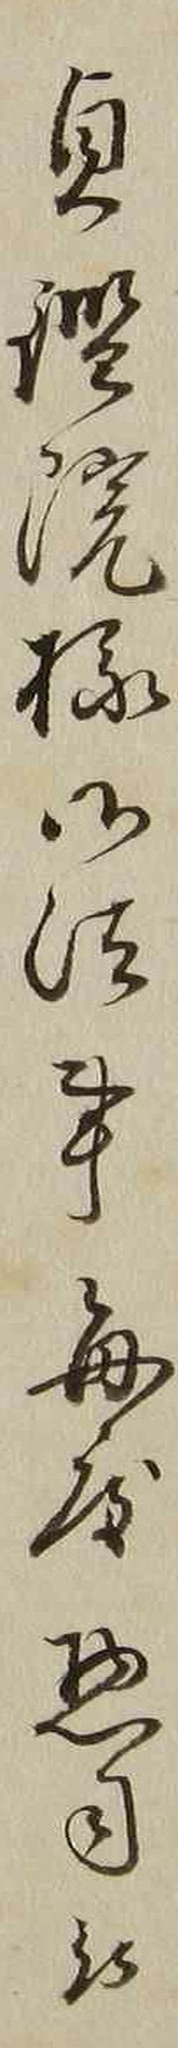貞鑑院様御法事毎度惣司被
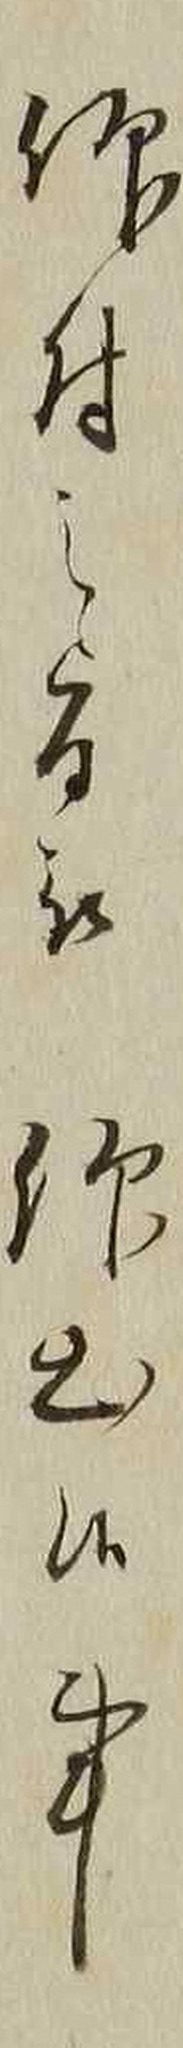仰付之旨被仰出候事
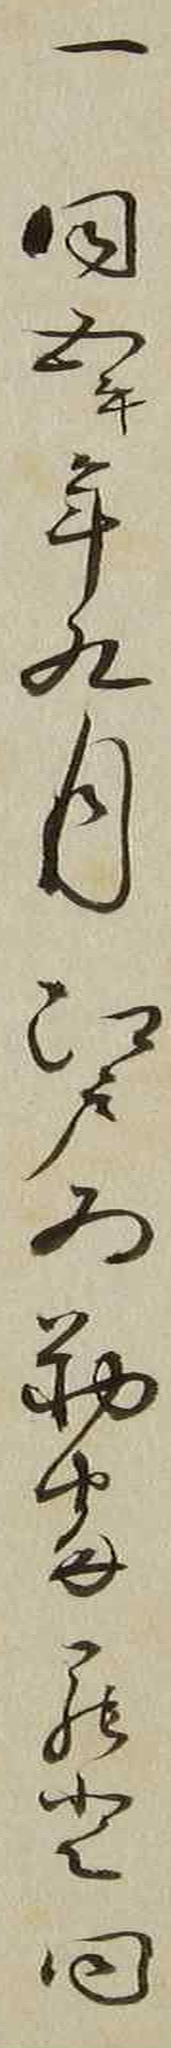一同五午年九月江戸為勤番罷登同
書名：諸士系譜　巻之204　や之部1
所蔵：会津若松市立会津図書館
